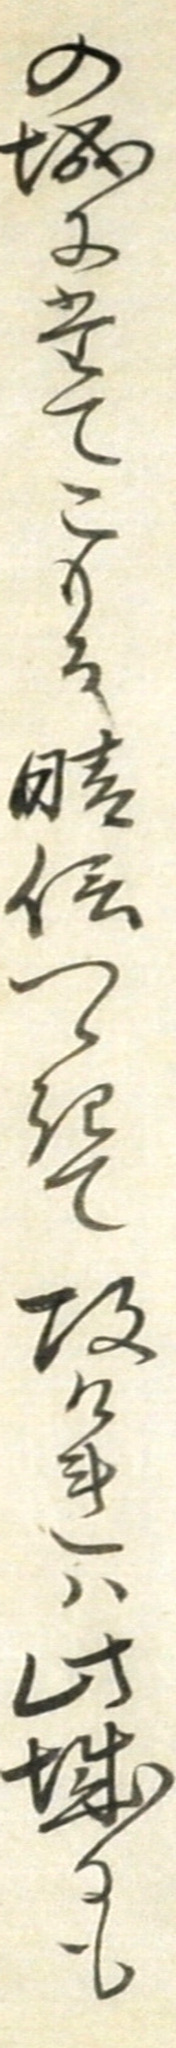の城にたてたてこもる晴信つゝきて攻けれは此城にも
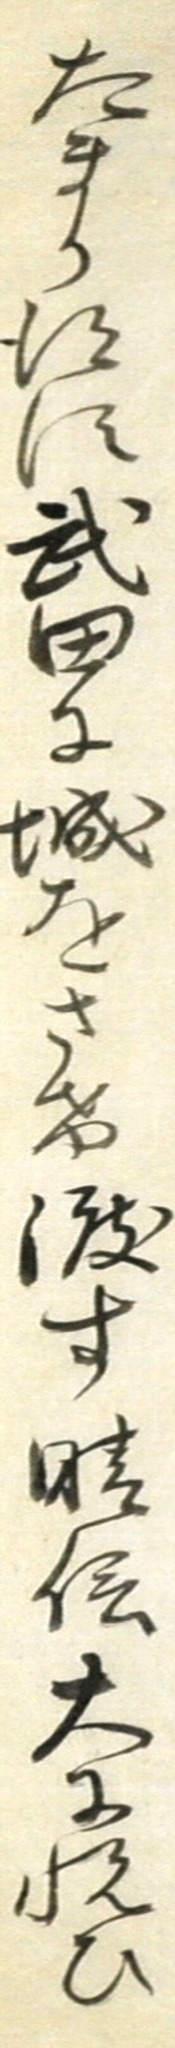たまり得す武田に城をさけ渡す晴信大に悦ひ
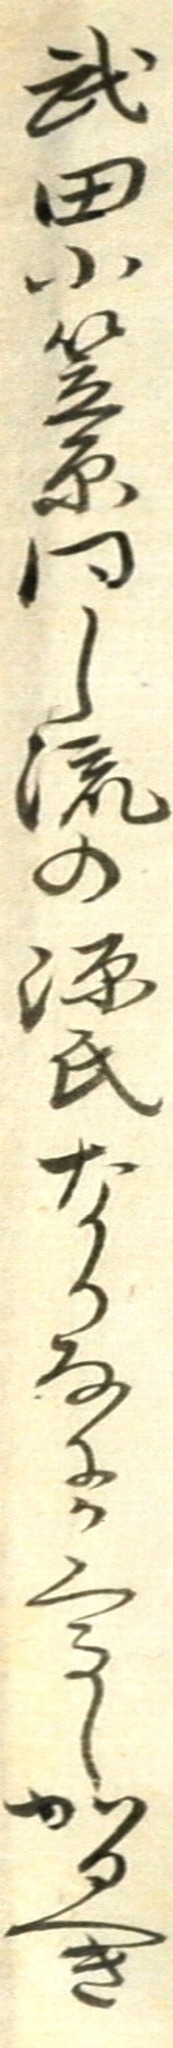武田小笠原同し流の源氏なりなにかくるしかるへき

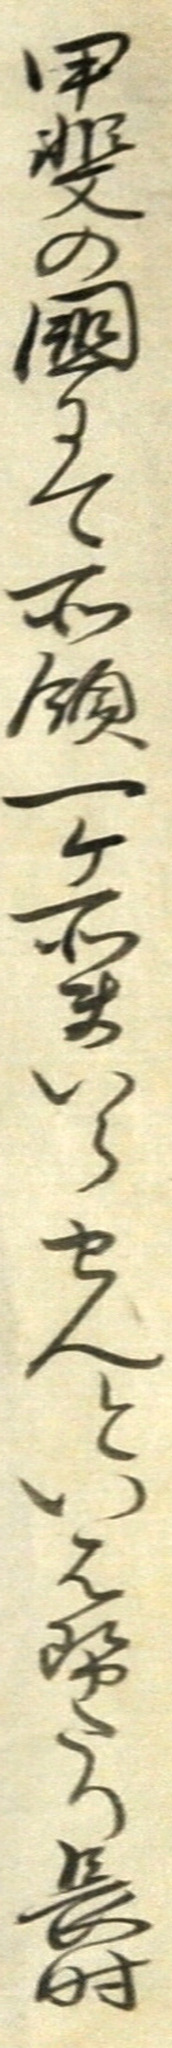甲斐の国にて所領一ヶ所まいらせんといはせたり長時
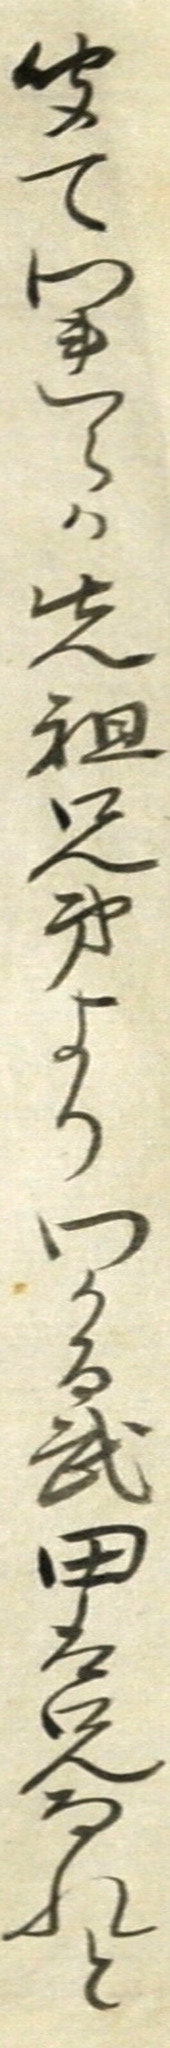聞てわれらか先祖兄弟よりわかる武田は兄なれと
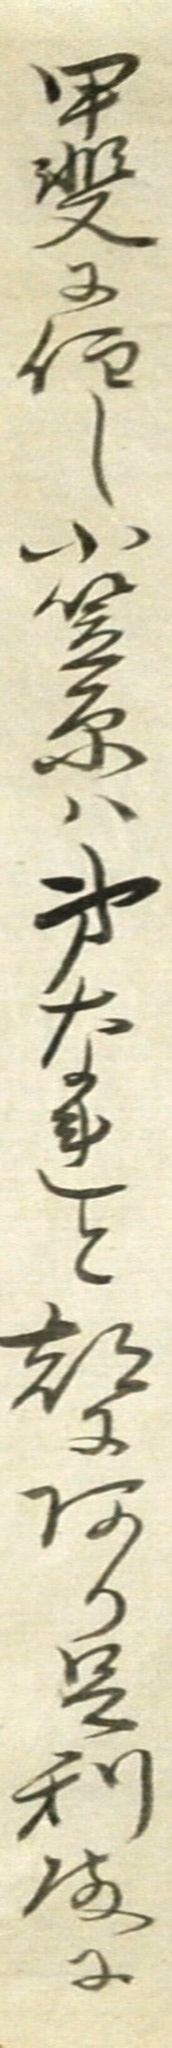甲斐に住し小笠原は弟なれと都にあり是足利殿に
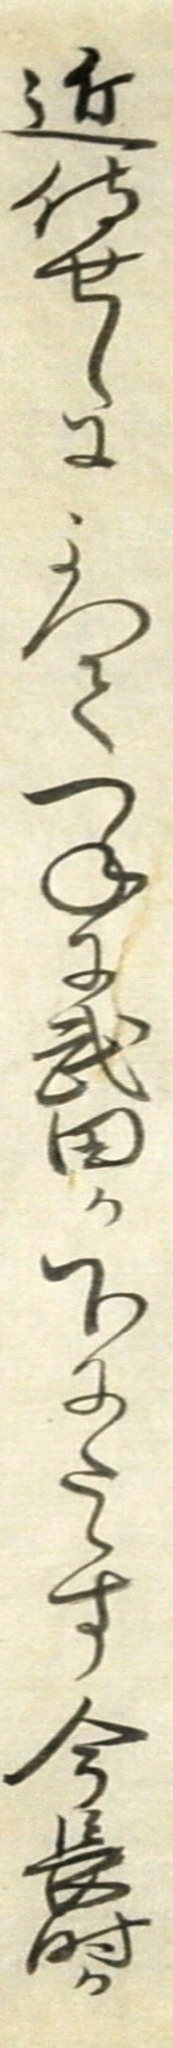近侍せしによつてつねに武田か下にたゝす今長時か
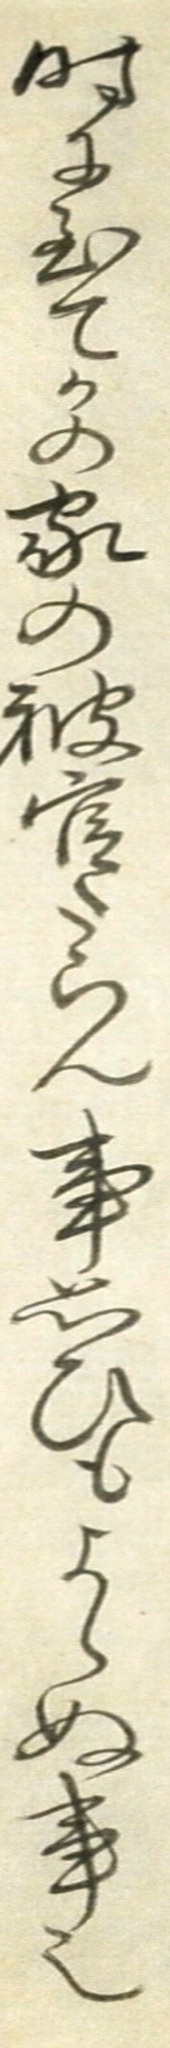時に至てかの家の被官たらん事思ひもよらぬ事也
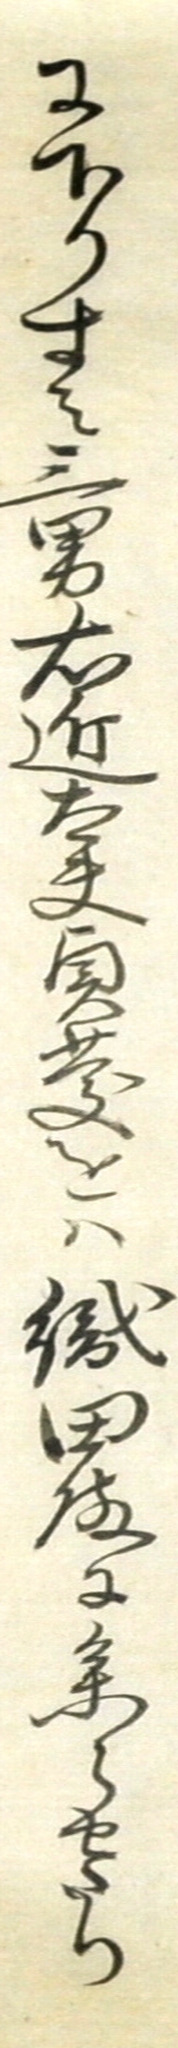に下りすみ三男右近太夫貞慶をは織田殿に参らせたり
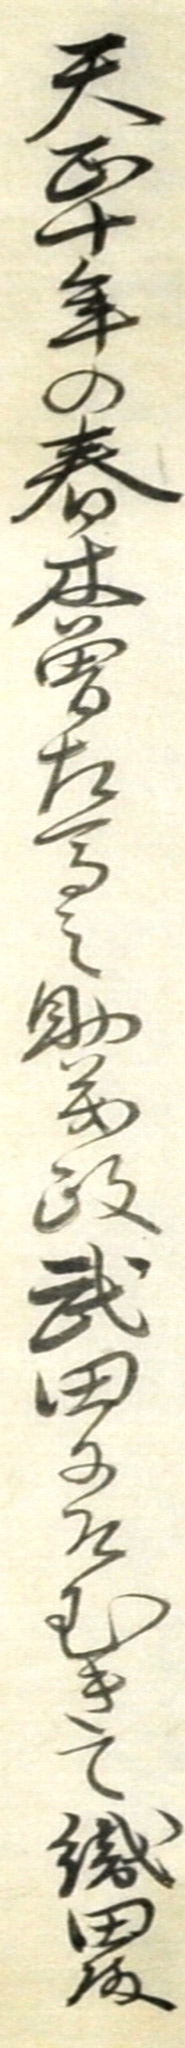天正十年の春木曽左馬之助義政武田にそむきて織田殿
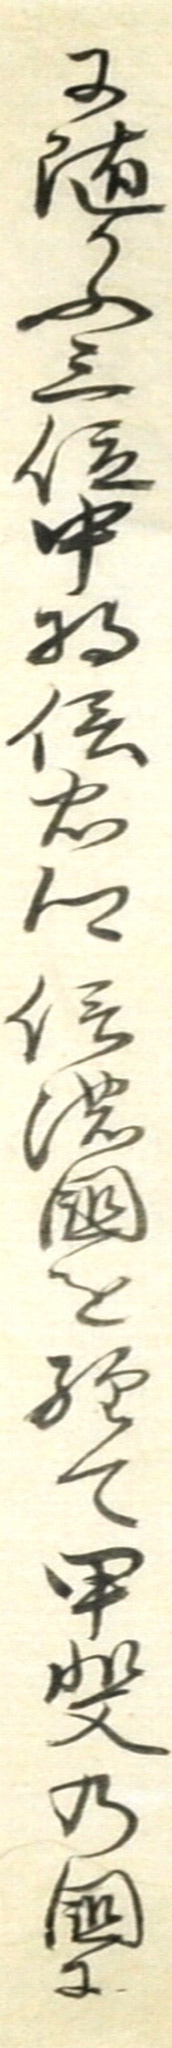に随かふ三位中将信忠卿信濃国を経て甲斐の国に
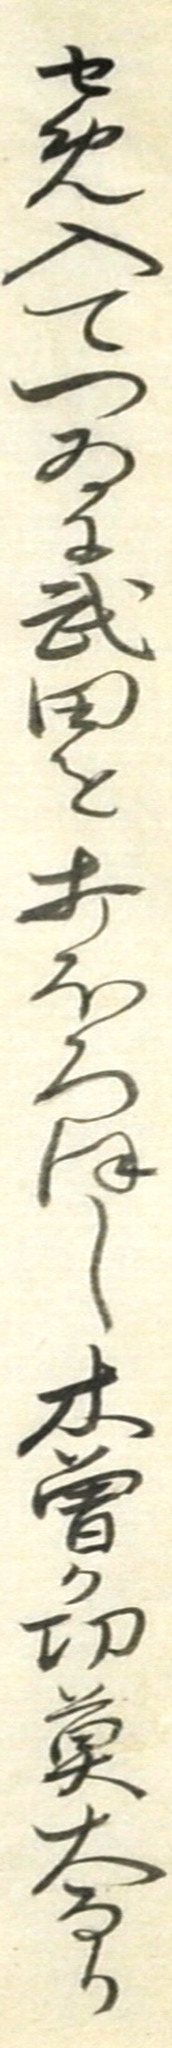せめ入てつゐに武田を打ほろほし木曽か功莫大なり
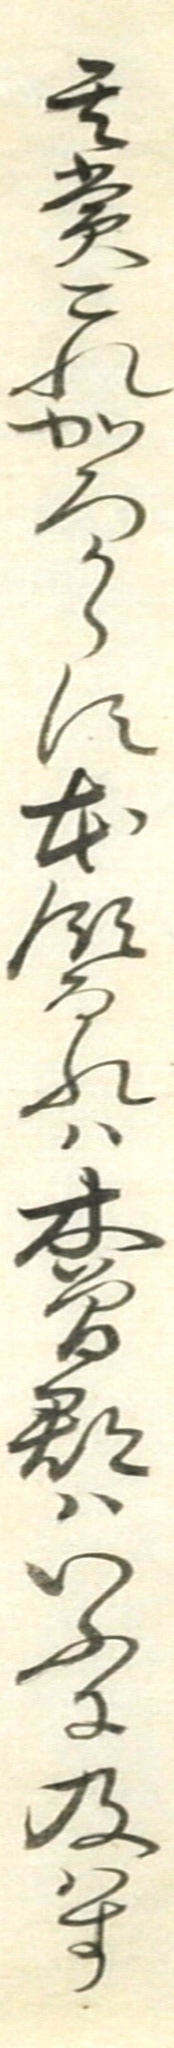其賞これかろからす本領なれは木曽郡はいふに及はす
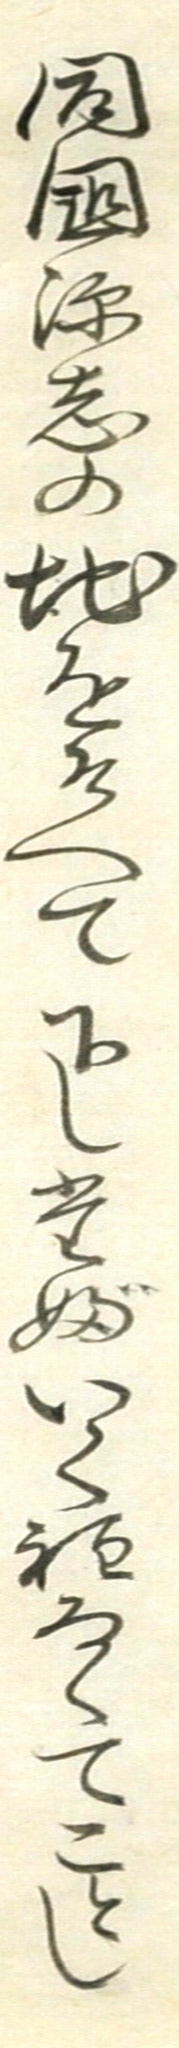同国深志の地をそへて下したぶいく程なくてことし
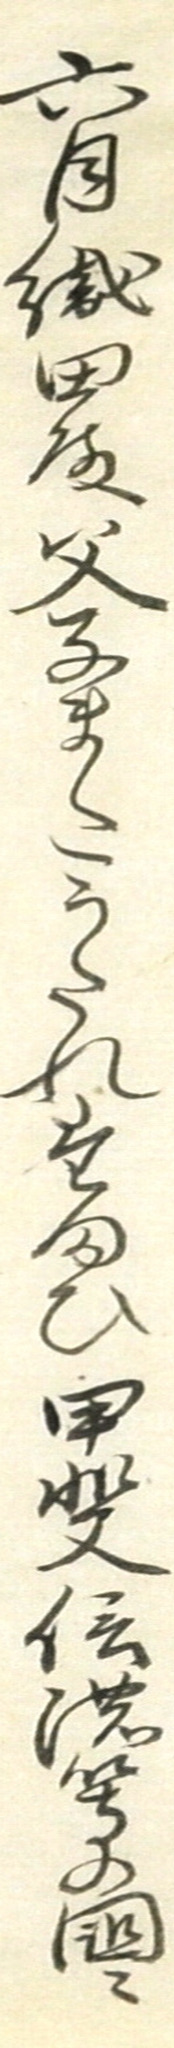六月織田殿父子またうたれたまひ甲斐信濃等の国々
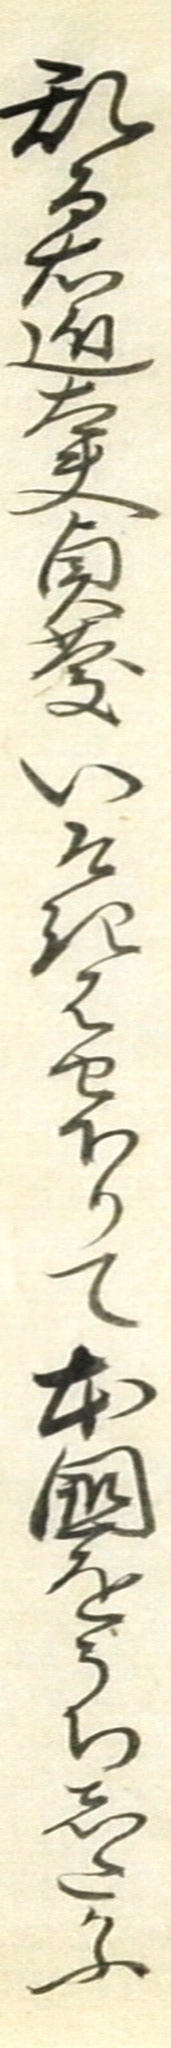乱る右近太夫貞慶いそきはせ下りて本国をうちしたかふ
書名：藩翰譜（六）
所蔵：伊那市立高遠町図書館・合同会社AMANE
